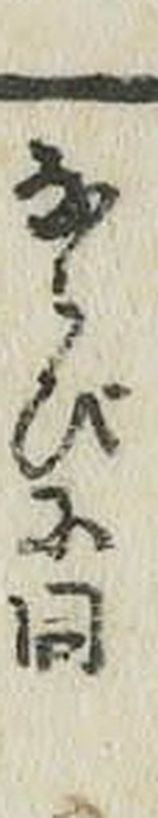ならびに同
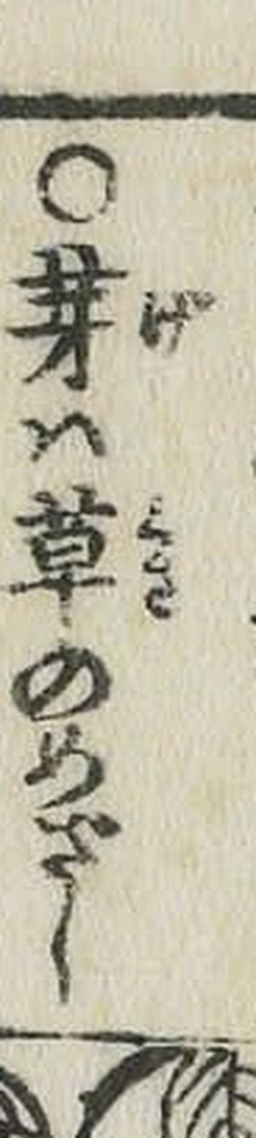○芽は草のめざし
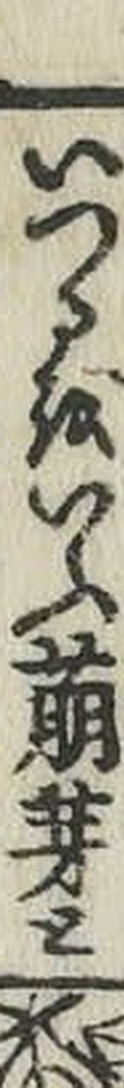いつるをいふ萌芽と
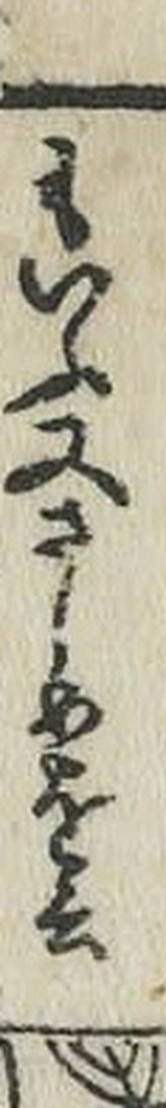もいふ又さしめを云

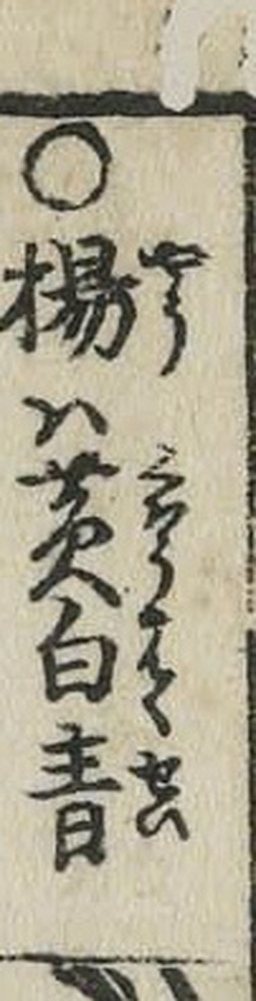○楊は黄白青
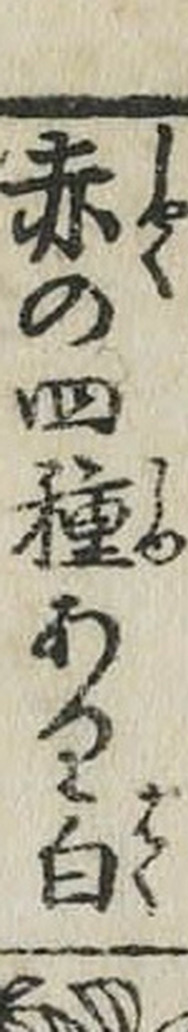赤の四種あり白
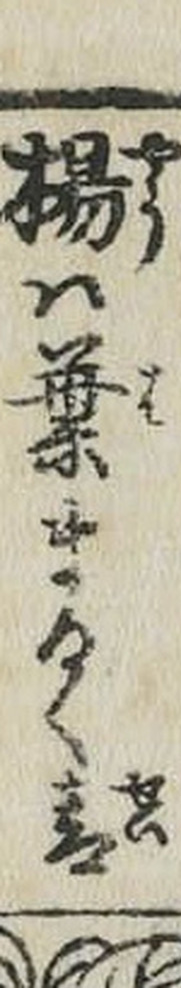楊は葉まるく青
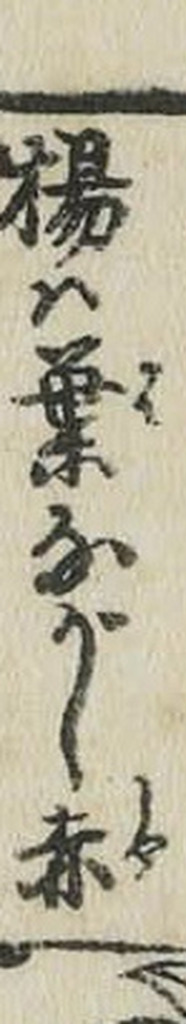楊は葉ながし赤
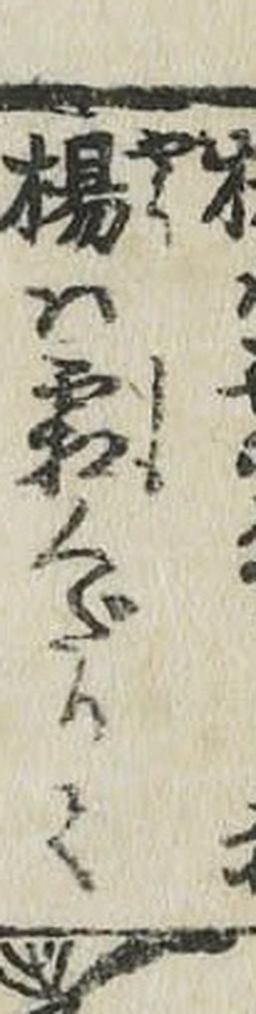楊は霜くだりて
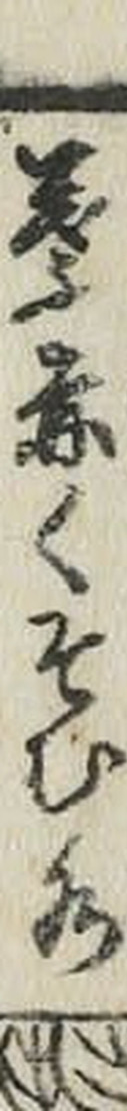葉赤くそむ水
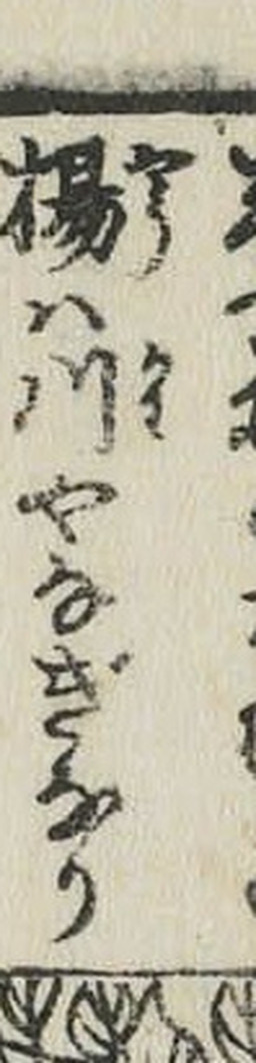楊は川やなぎなり
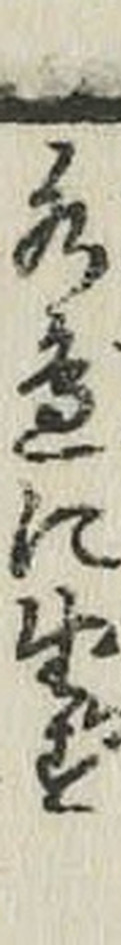水辺に生ず
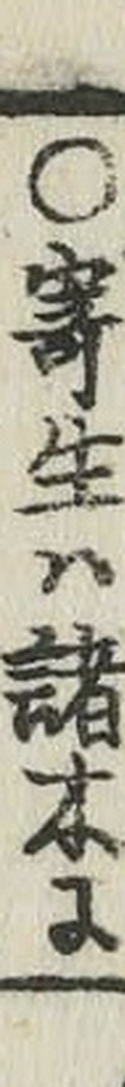○寄生は諸木に
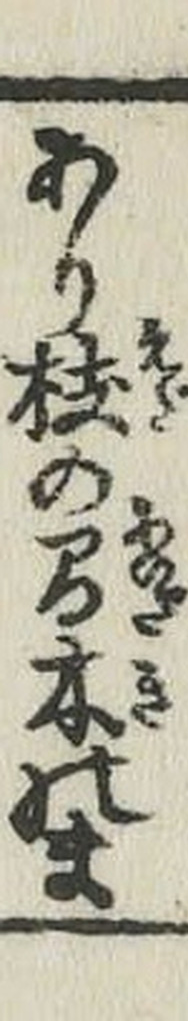あり枝の間木のま
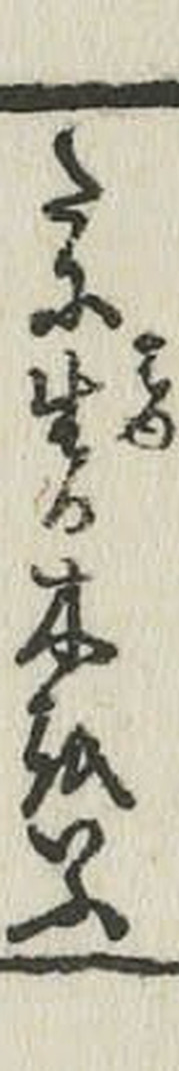たに生る木をいふ
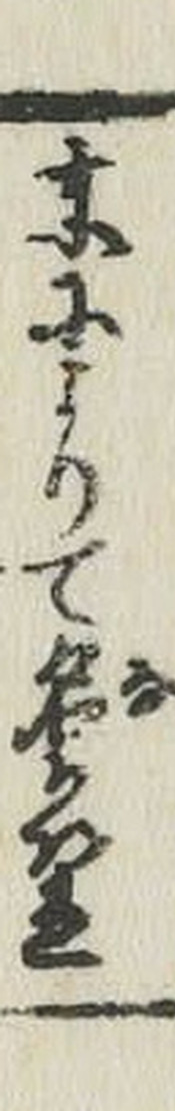木によりて名かはれ
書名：増補頭書訓蒙図彙大成 10巻 8:巻之17-19
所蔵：東京学芸大学教育コンテンツアーカイブ
